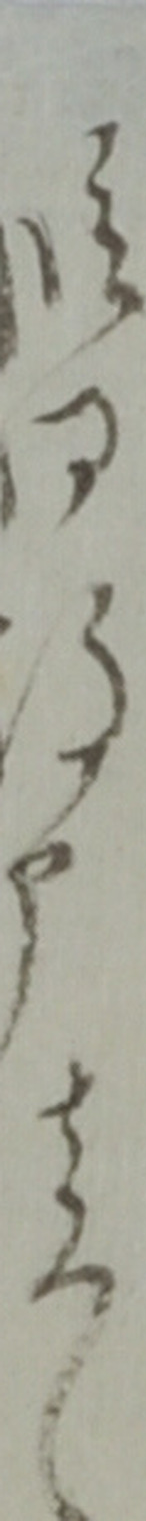段同役申談候
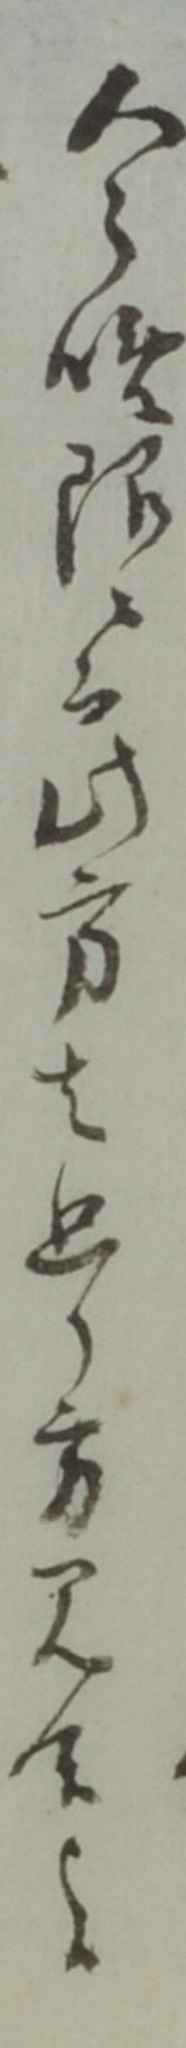今晩限ニ而此方者廻リ方見合候之

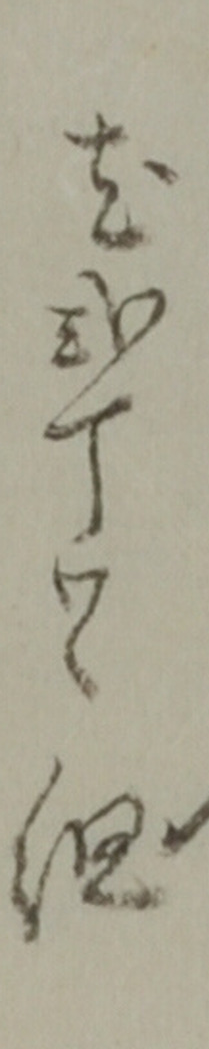尤弐丁ツヽ組
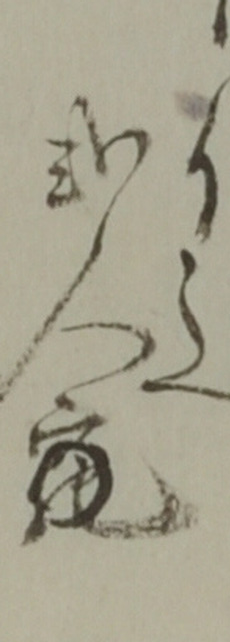弐人宛
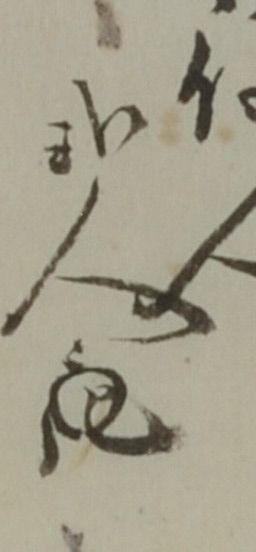弐人宛
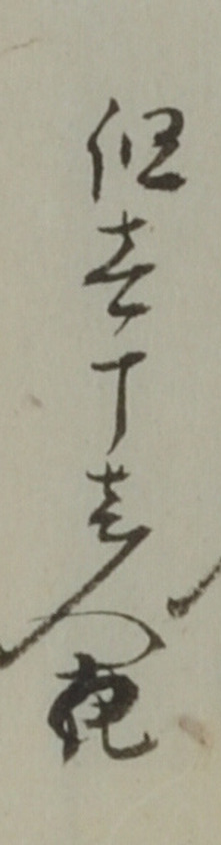但壱丁壱人宛
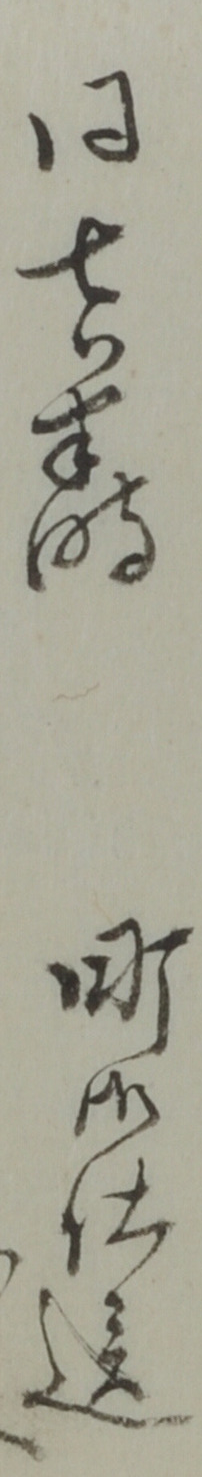同七ツ半時町御仕送
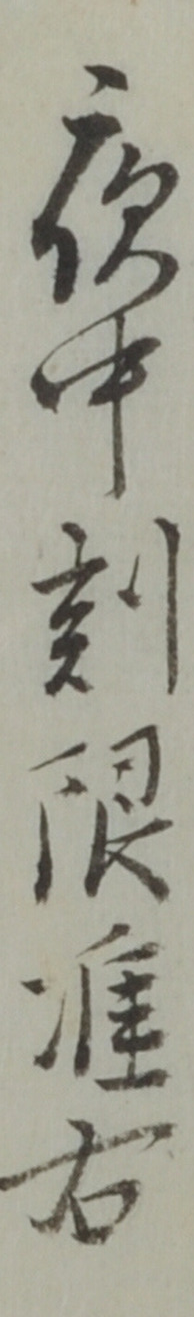夜中刻限准右

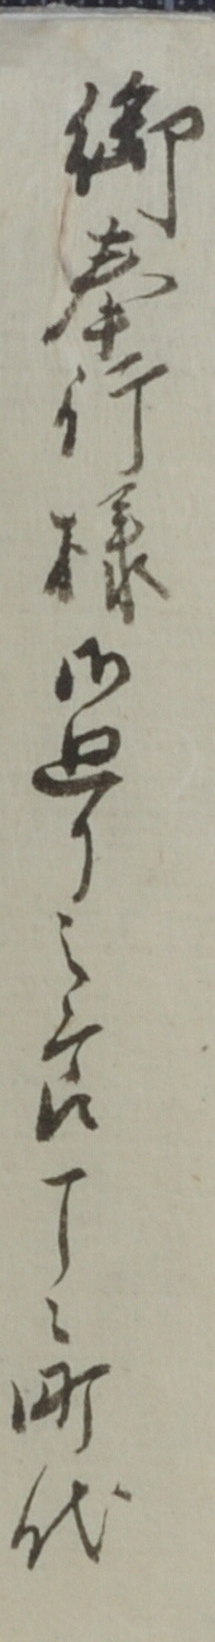御奉行様御廻リ之節丁々町代
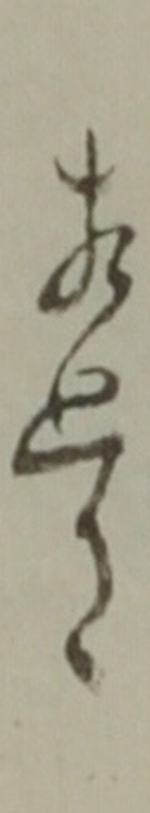相廻リ候
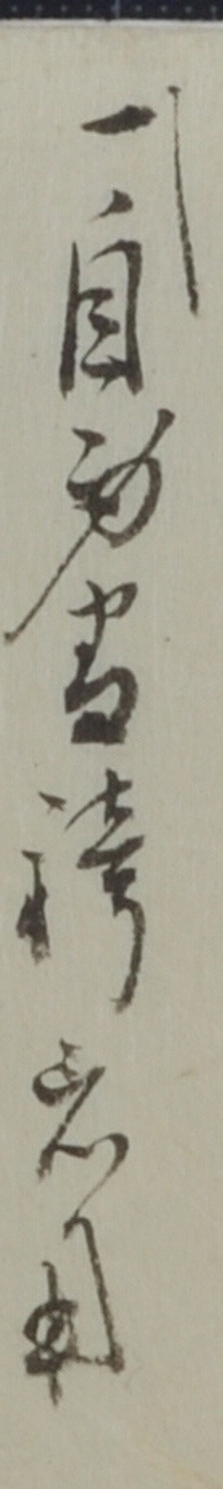一自身番袴着用
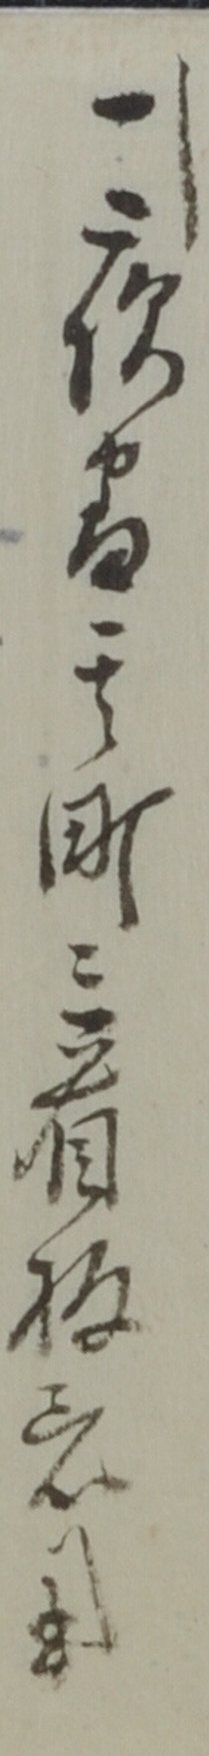一夜番其町ニ看板着用
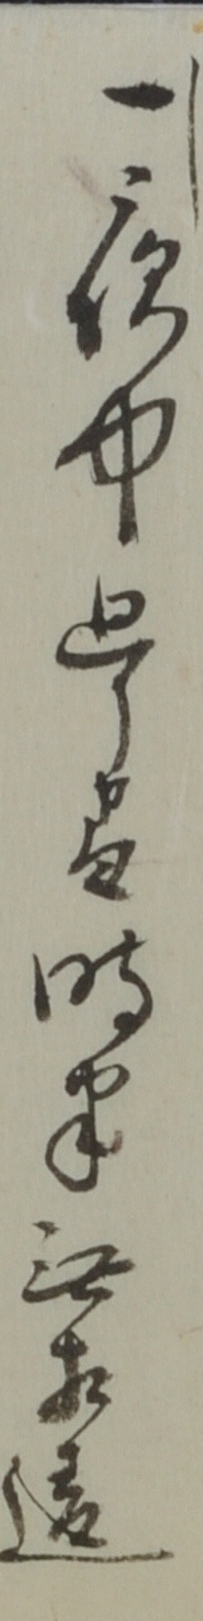一夜中廻リ番時半無相違
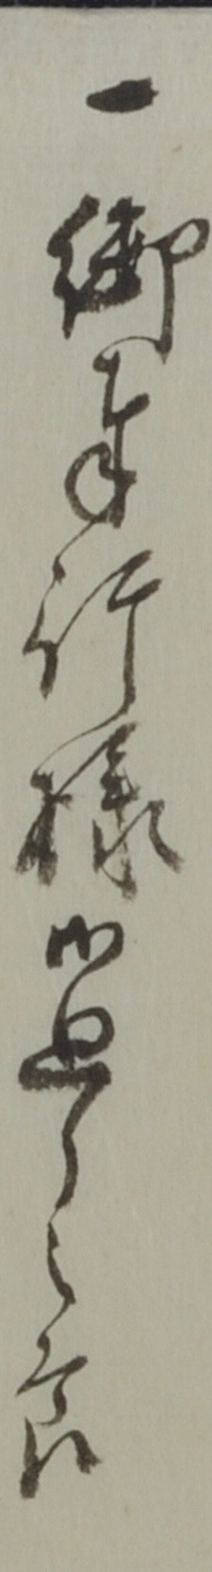一御奉行様御廻リ之節
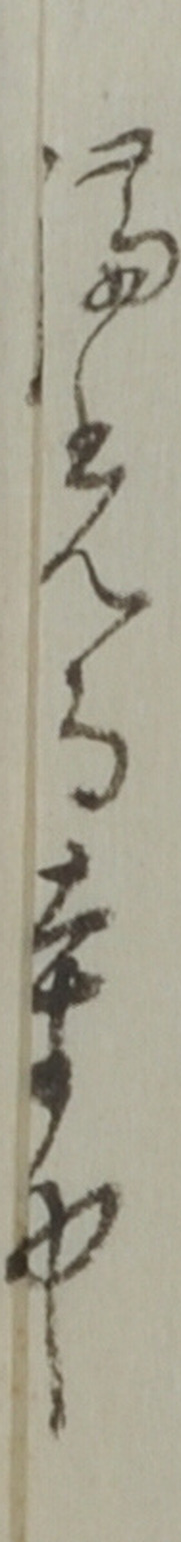満光寺奉中
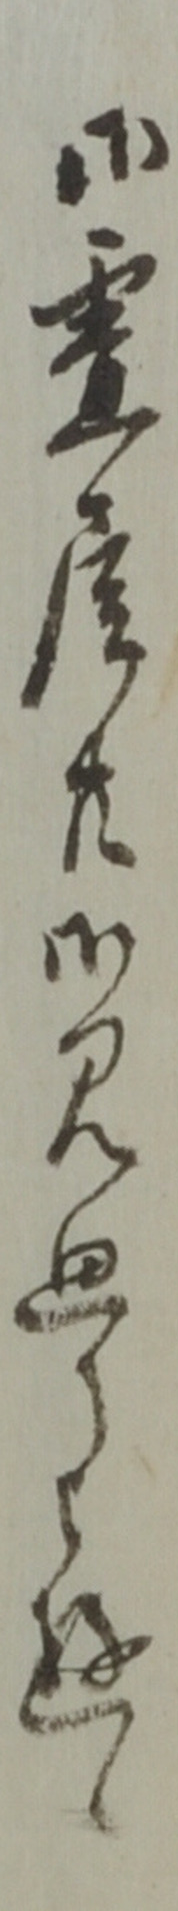御霊屋共御見廻リ被遊候
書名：日光御参詣ニ付町方警固番割名前控
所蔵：伊那市立高遠町図書館・合同会社AMANE
